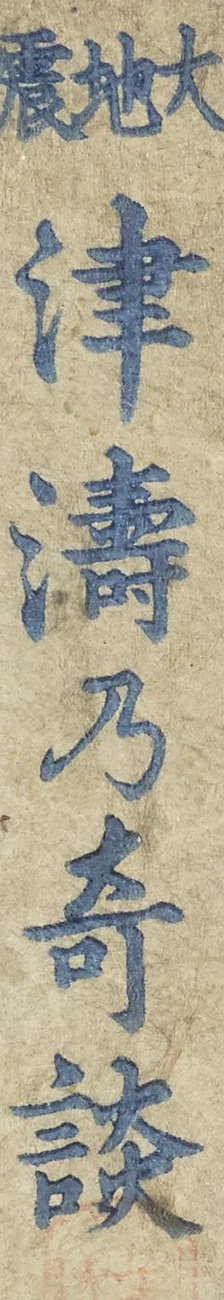地津濤乃奇談

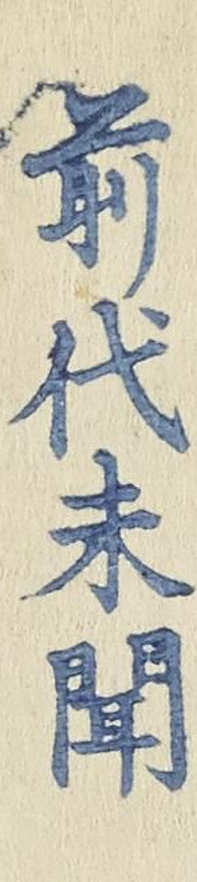前代未聞
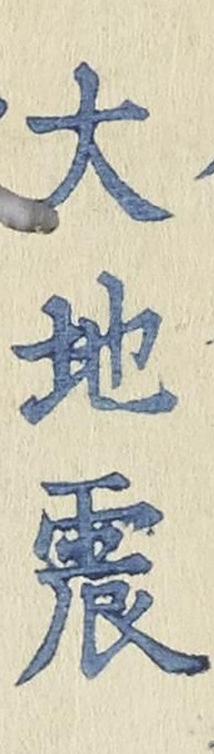大地震
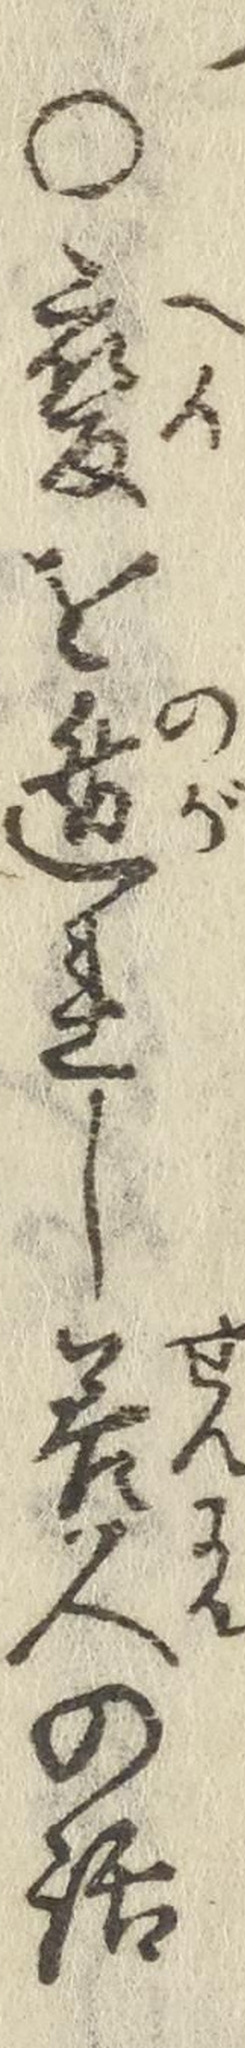○変を遁れし善人の話
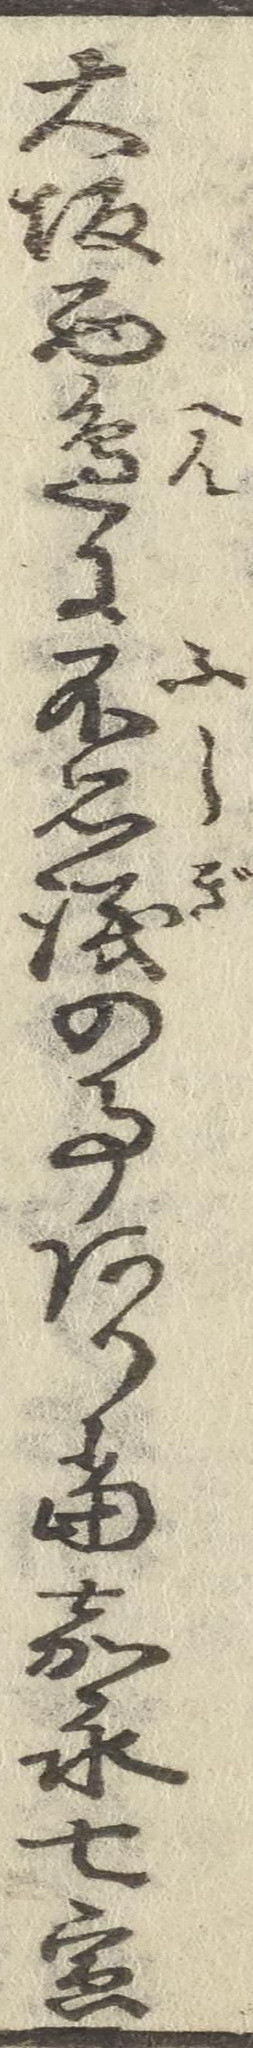大坂西辺に不思議の事あり当嘉永七寅
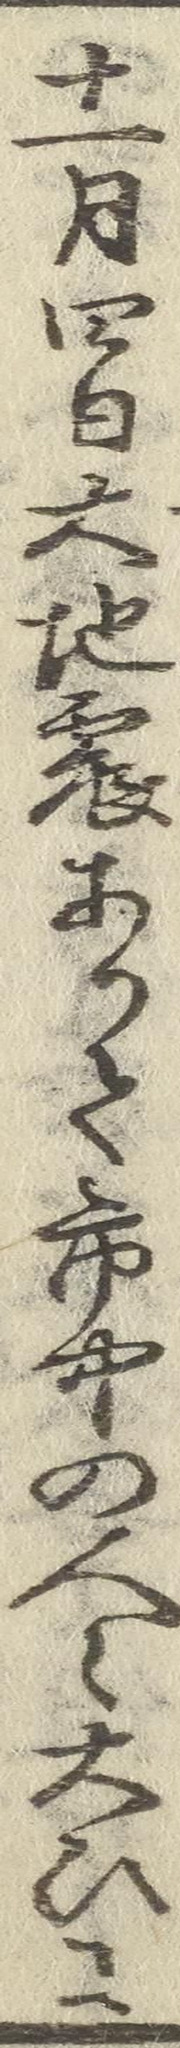十一月四日大地震ありて市中の人々大ひに
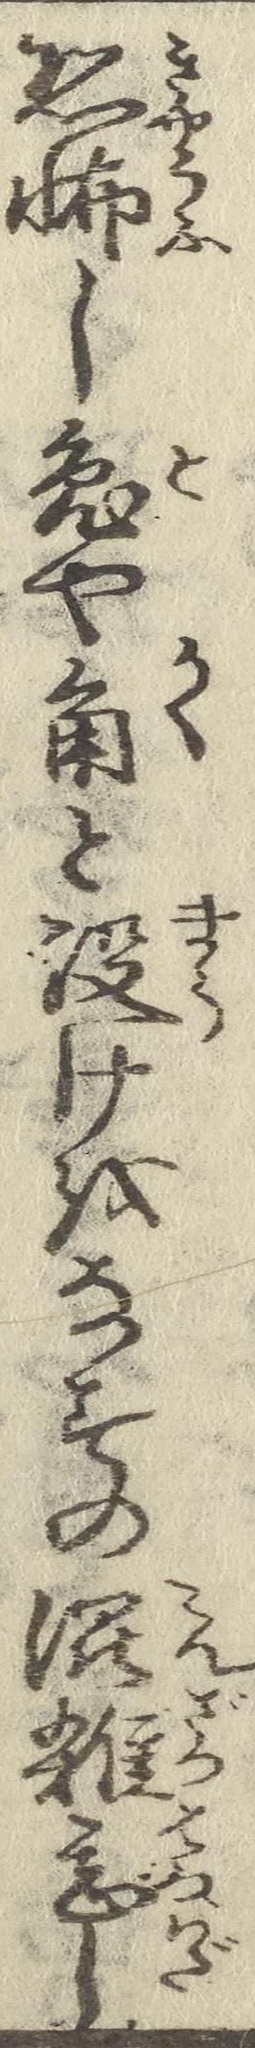恐怖し兎や角と設けをなすの混雑甚し
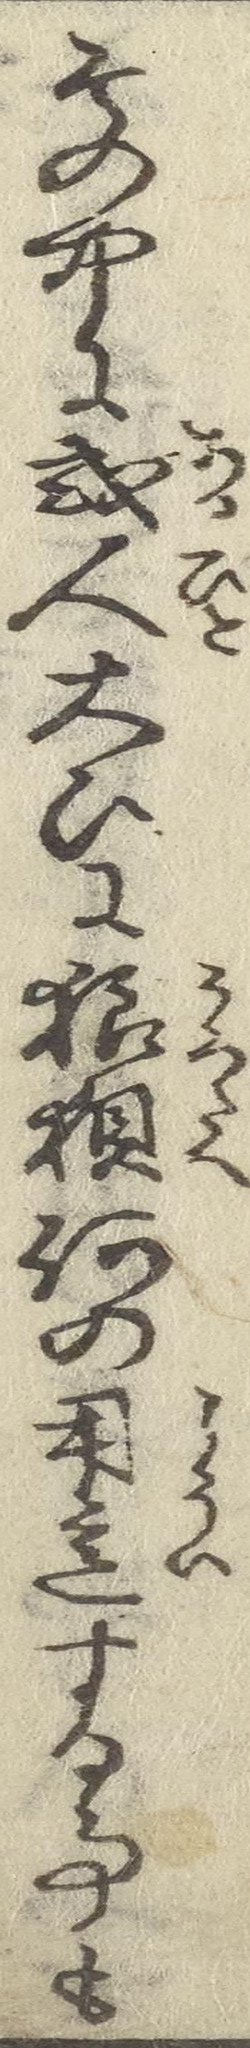その中に或人大ひに狼狽何の用意する事も
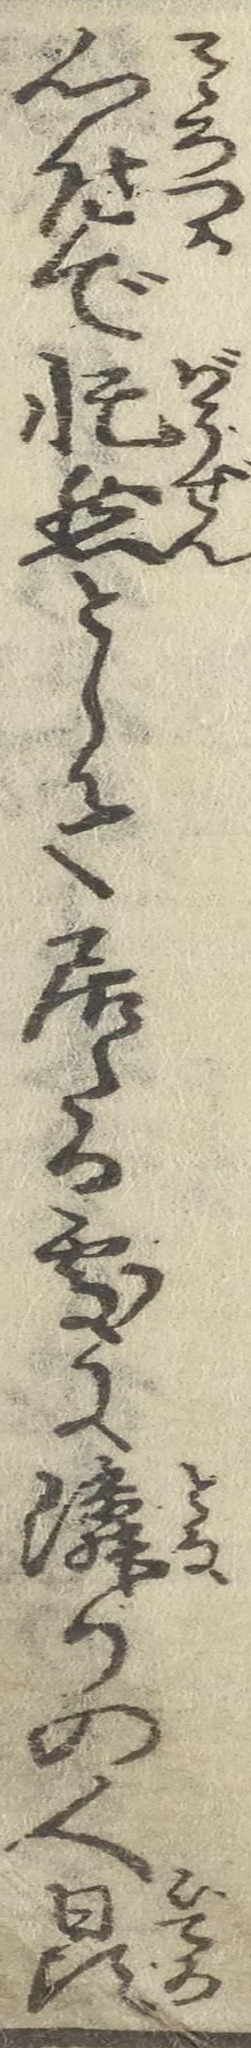心付で忙然として居たる処に隣りの人日頃

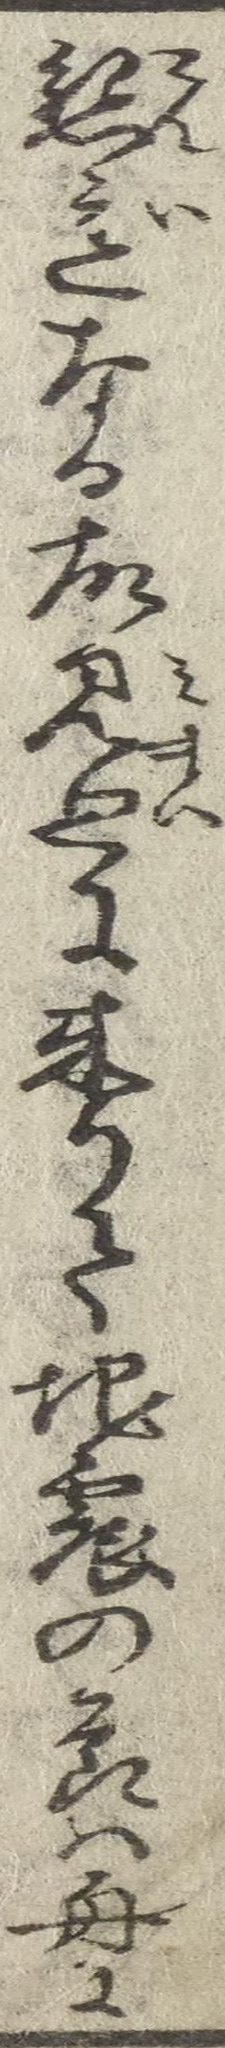懇意なる故見廻に来りて地震の節は舟に
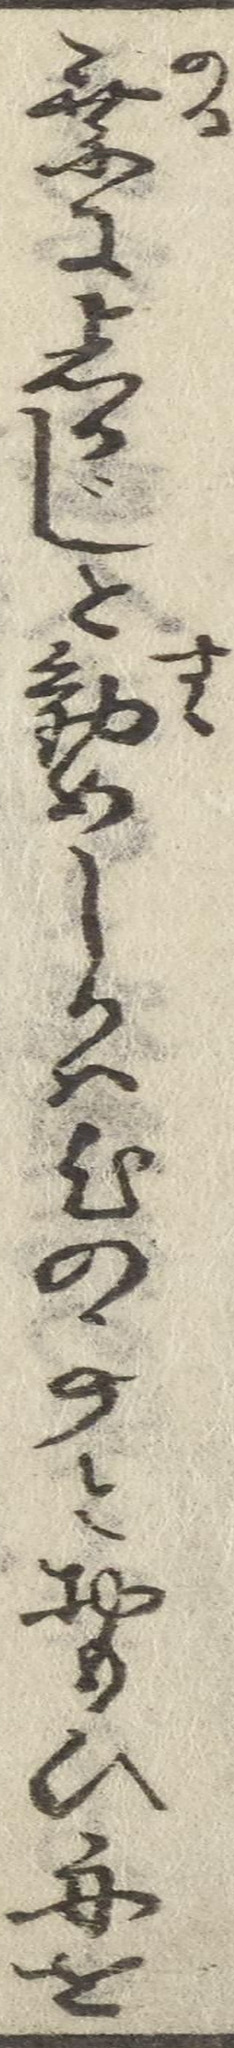乗にしかじと勧めしかは尤の事とおもひ舟を
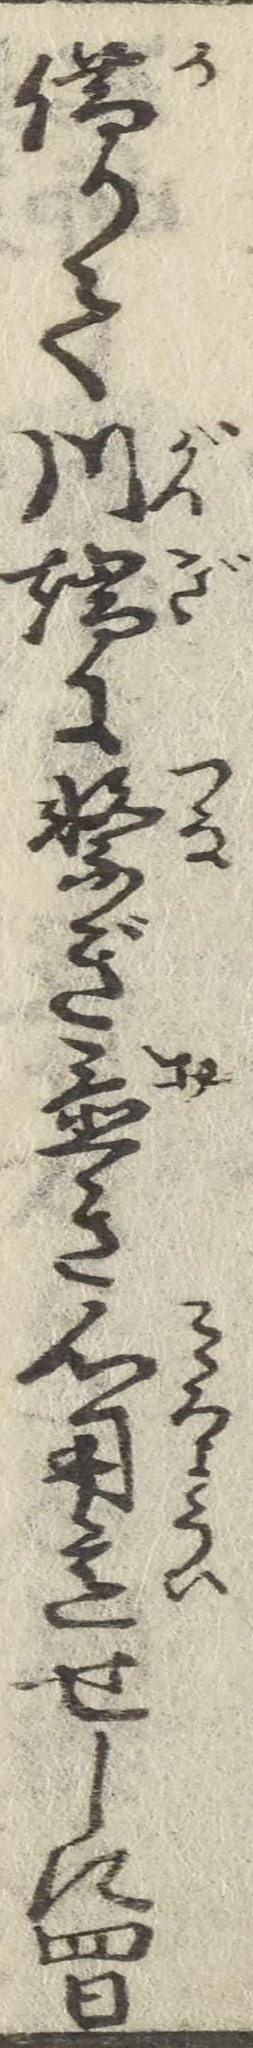借りて川端に繋ぎ置き心用意せしに四日
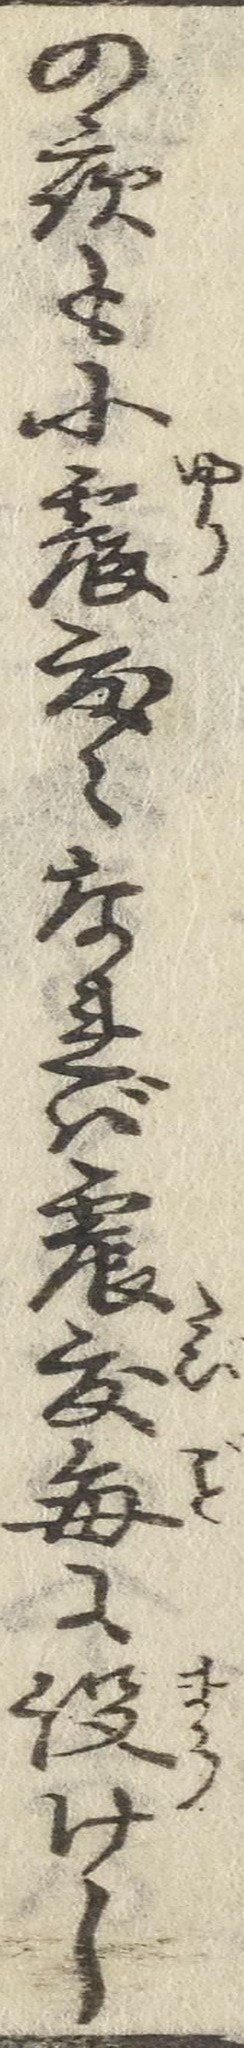の夜も小震度々なれば震度毎に設けし
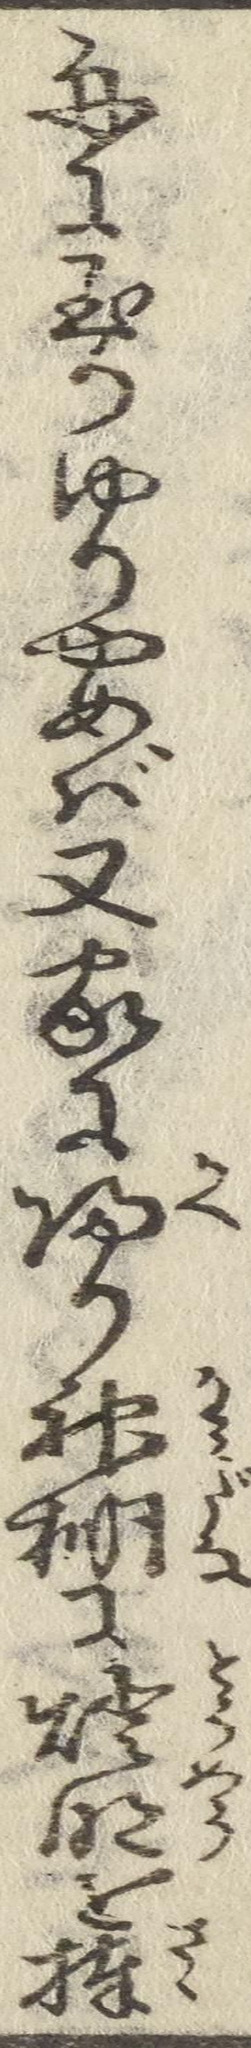舟に至りゆりやめば又家に帰り神棚に燈明を捧
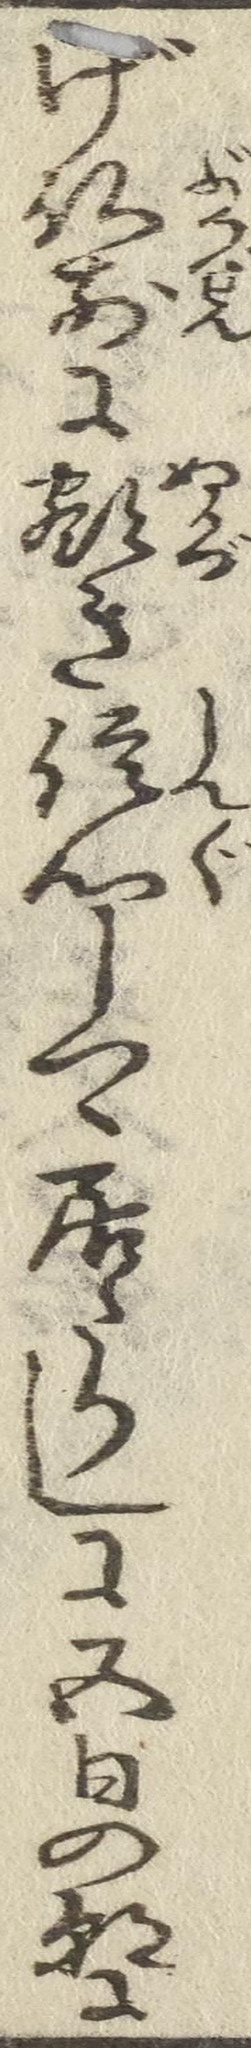げ仏前に額き信心して居たりしに五日の朝に
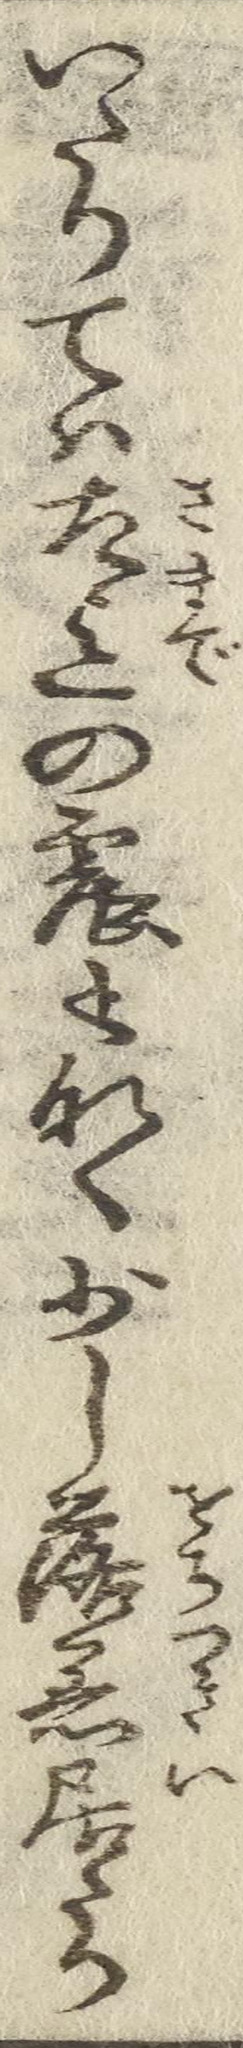いたりては左迄の震もなく少し落着居たり
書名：大地震　津涛乃奇談　第二集
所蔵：東京大学地震研究所図書室 Earthquake Research Institute Library, The University of Tokyo, JAPAN
